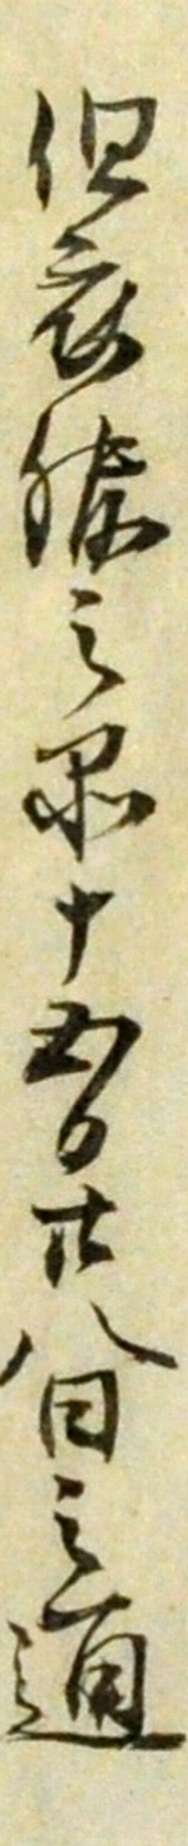但衣服之品十五日廿八日之通
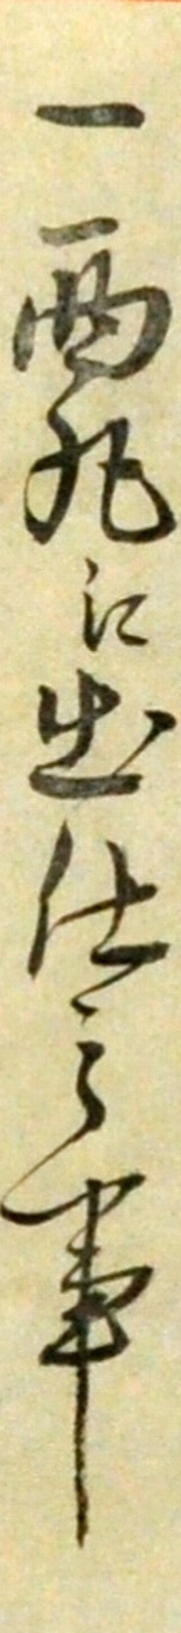一西丸え出仕之事
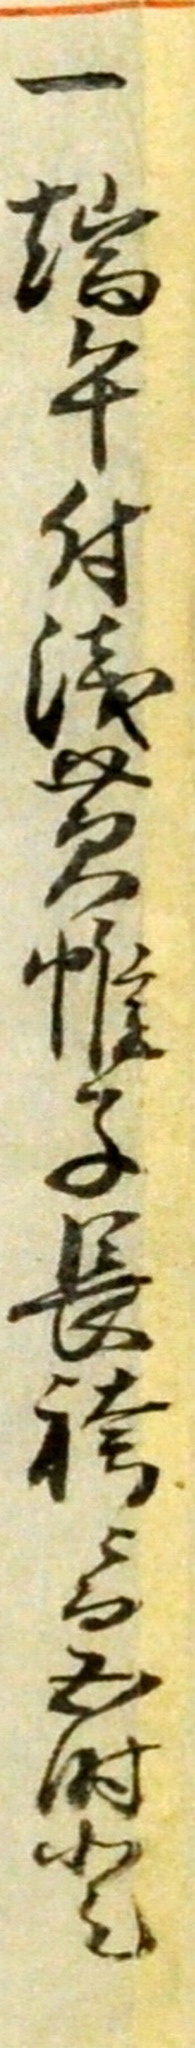一端午付浅黄帷子長袴にて五時登
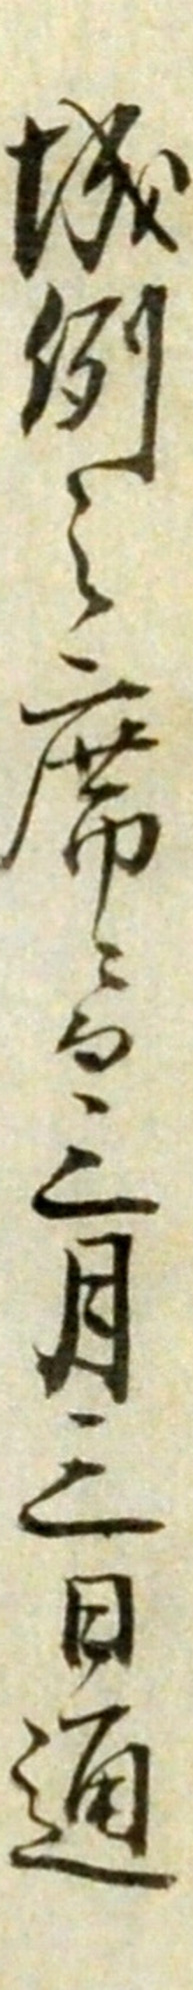城例之席にて三月三日通
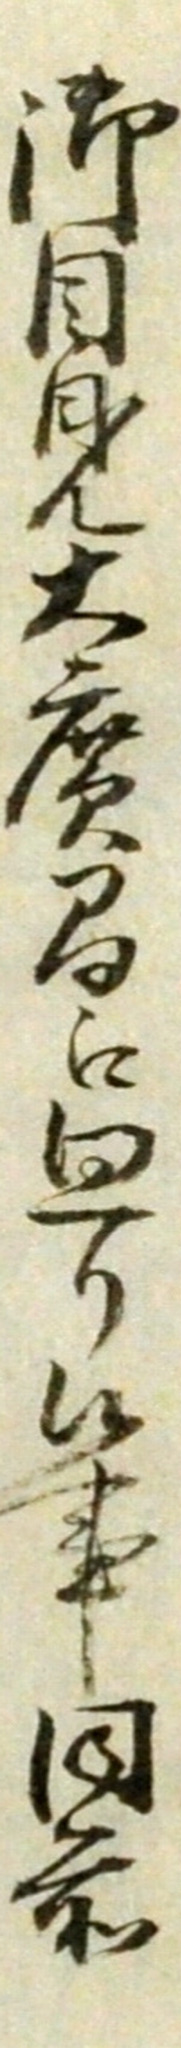御目見大広間え廻り候事同前
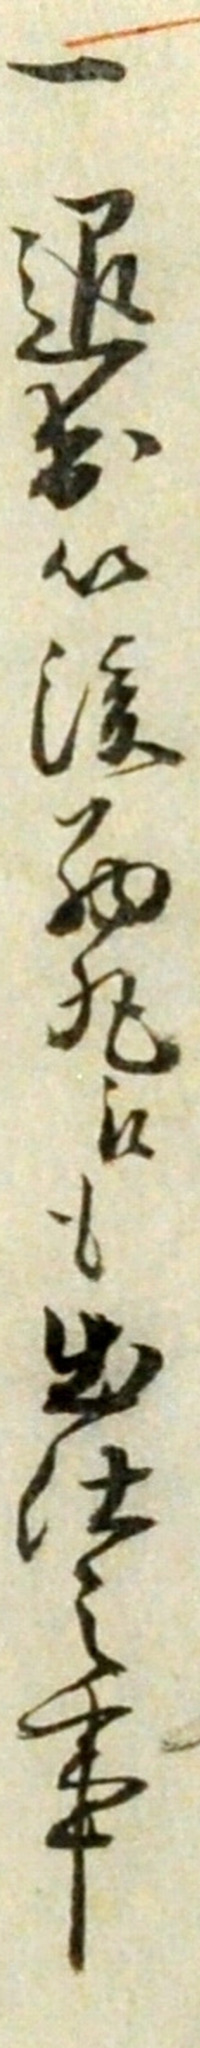一退出以後西丸えも出仕之事
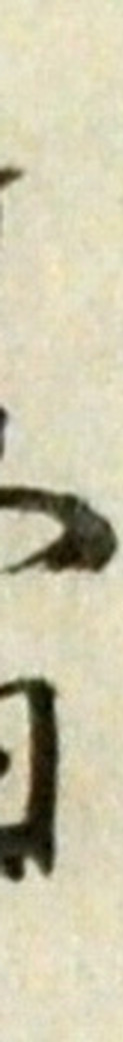十五日

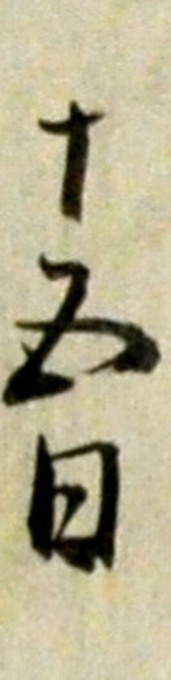十五日
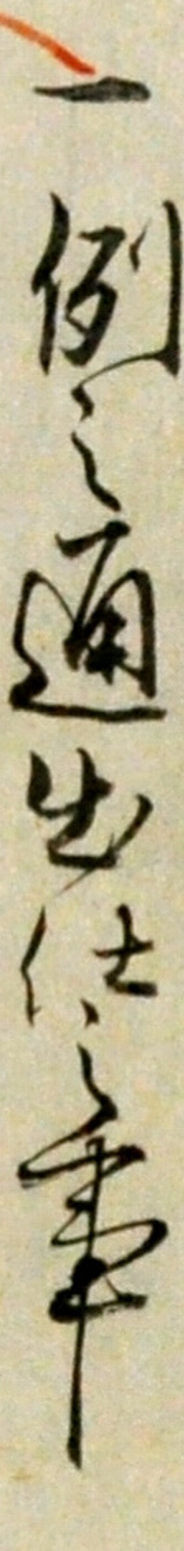一例之通出仕之事
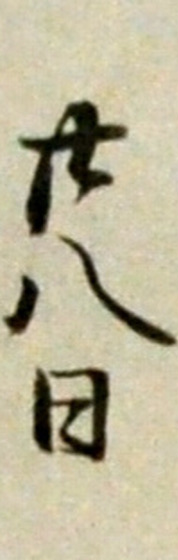廿八日
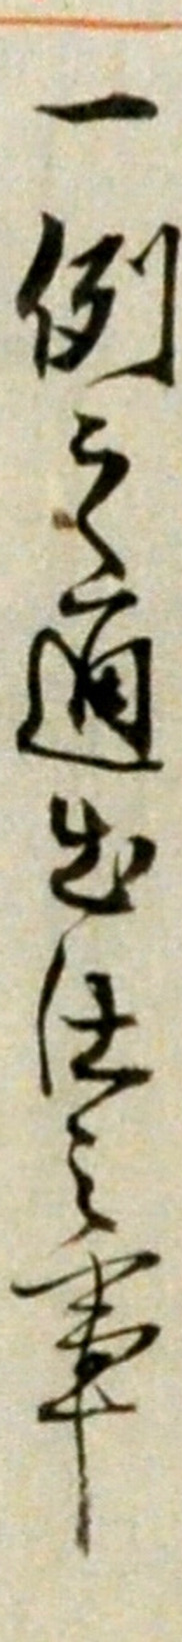一例之通出仕之事
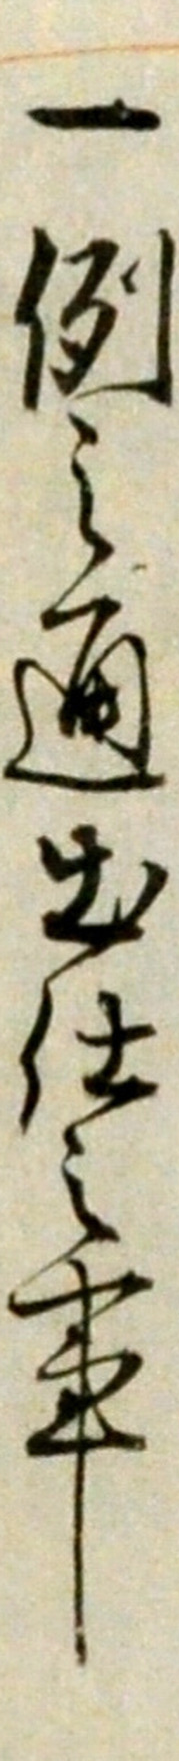一例之通出仕之事
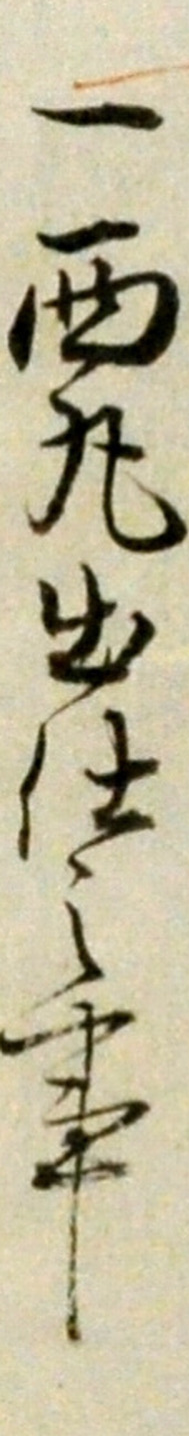一西丸出仕之事
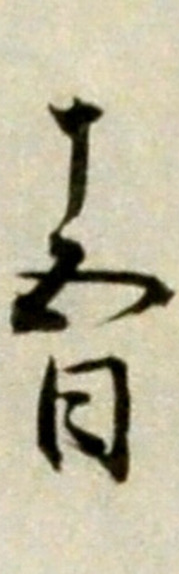十五日
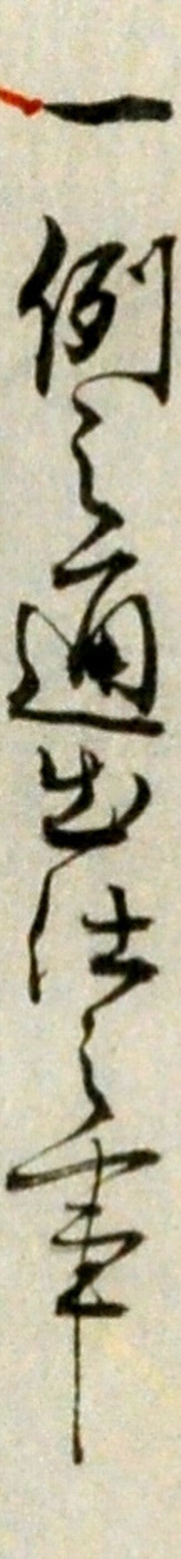一例之通出仕之事
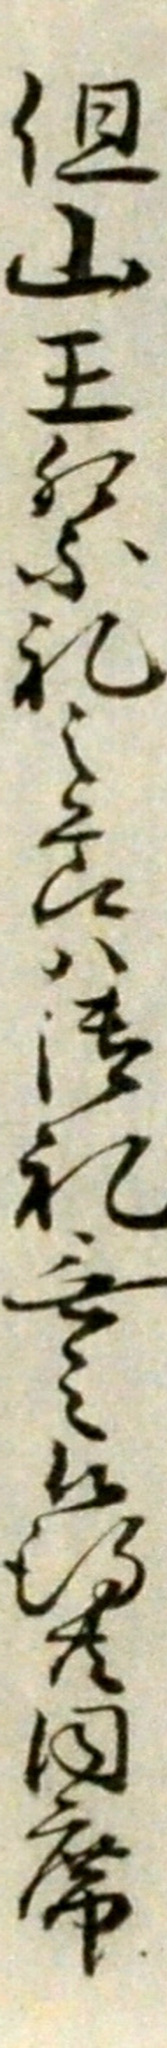但山王祭礼之節は御礼無之候得共同席
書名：申合帳〔一括〕
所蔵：伊那市立高遠町図書館・合同会社AMANE
